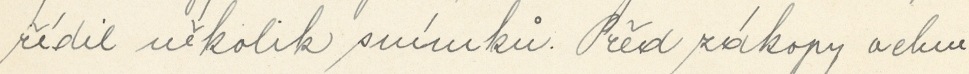řídil několik snímků. Před zákopy velmi
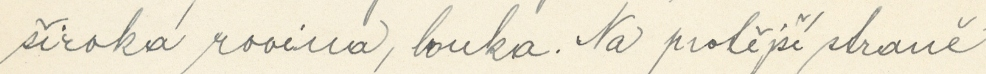široká rovina, louka. Na protější straně
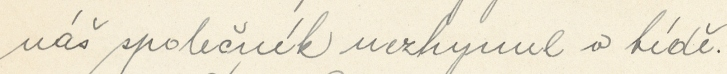náš společník nezhynul v bídě.
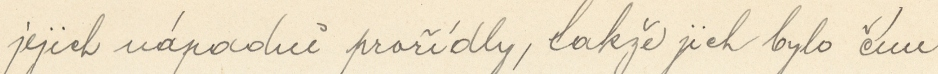jejich nápadně prořídly, takže jich bylo čím
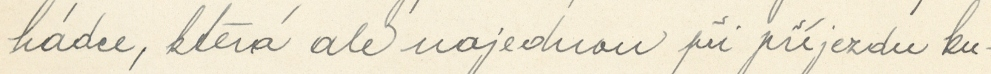hádce, která ale najednou při příjezdu ku-
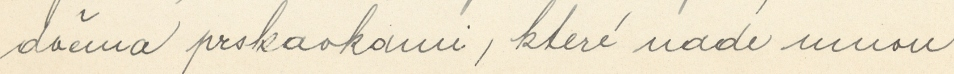dvěma prskavkami, které nade mnou
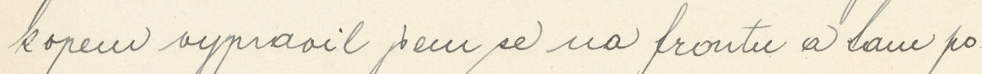kopem vypravil jsem se na frontu a tam po-
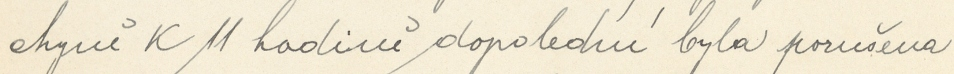chyně k 11. hodině dopolední byla porušena
